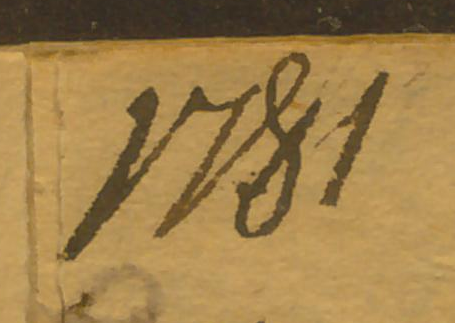1781
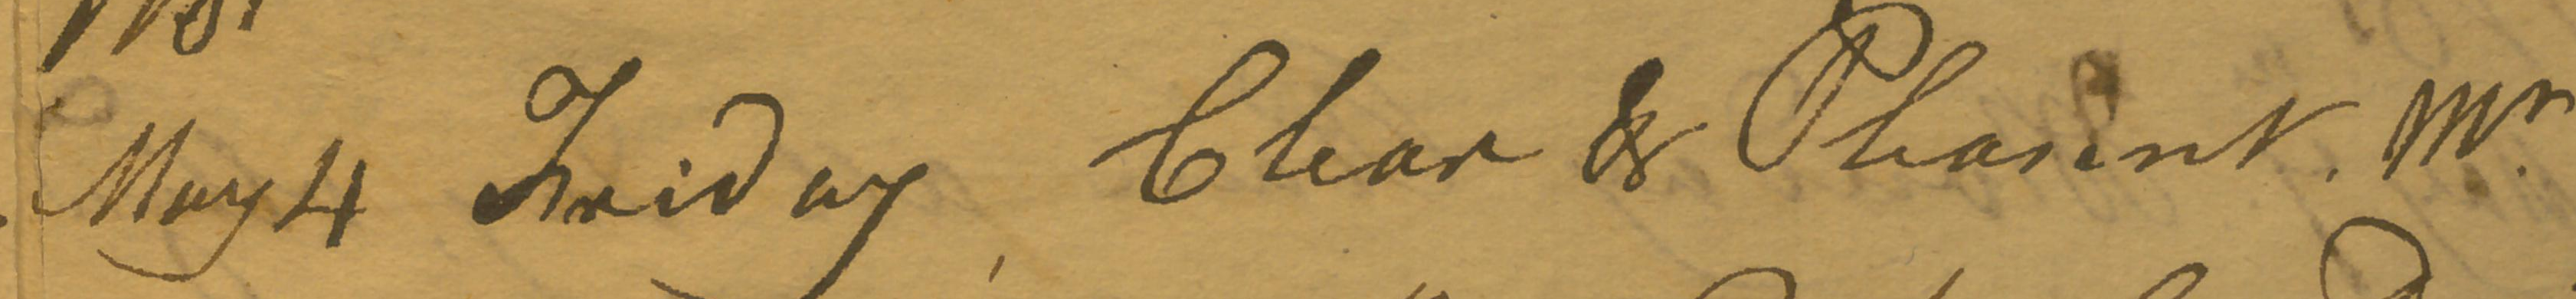May 4 Friday Clear & Pleasent. M^r.
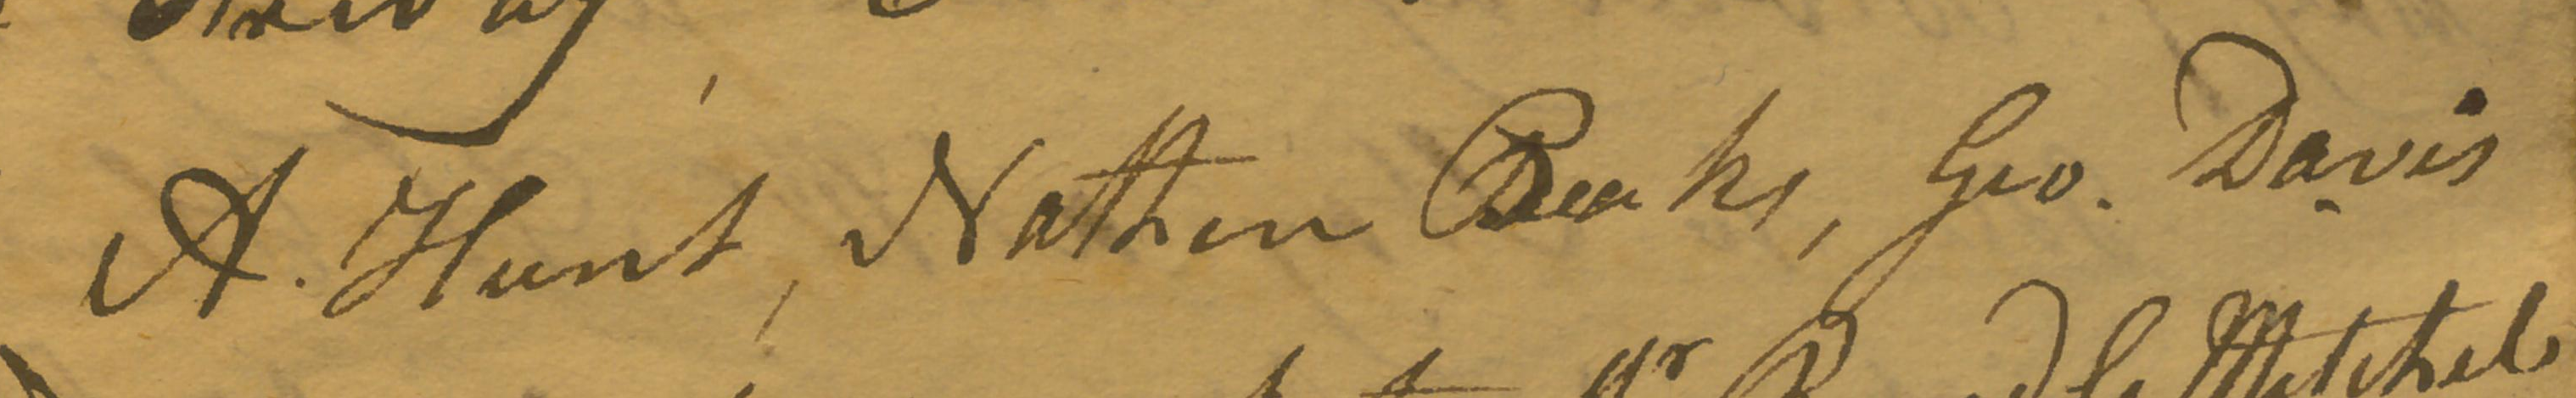A. Hunt Nathen Reaks, Geo. Davis
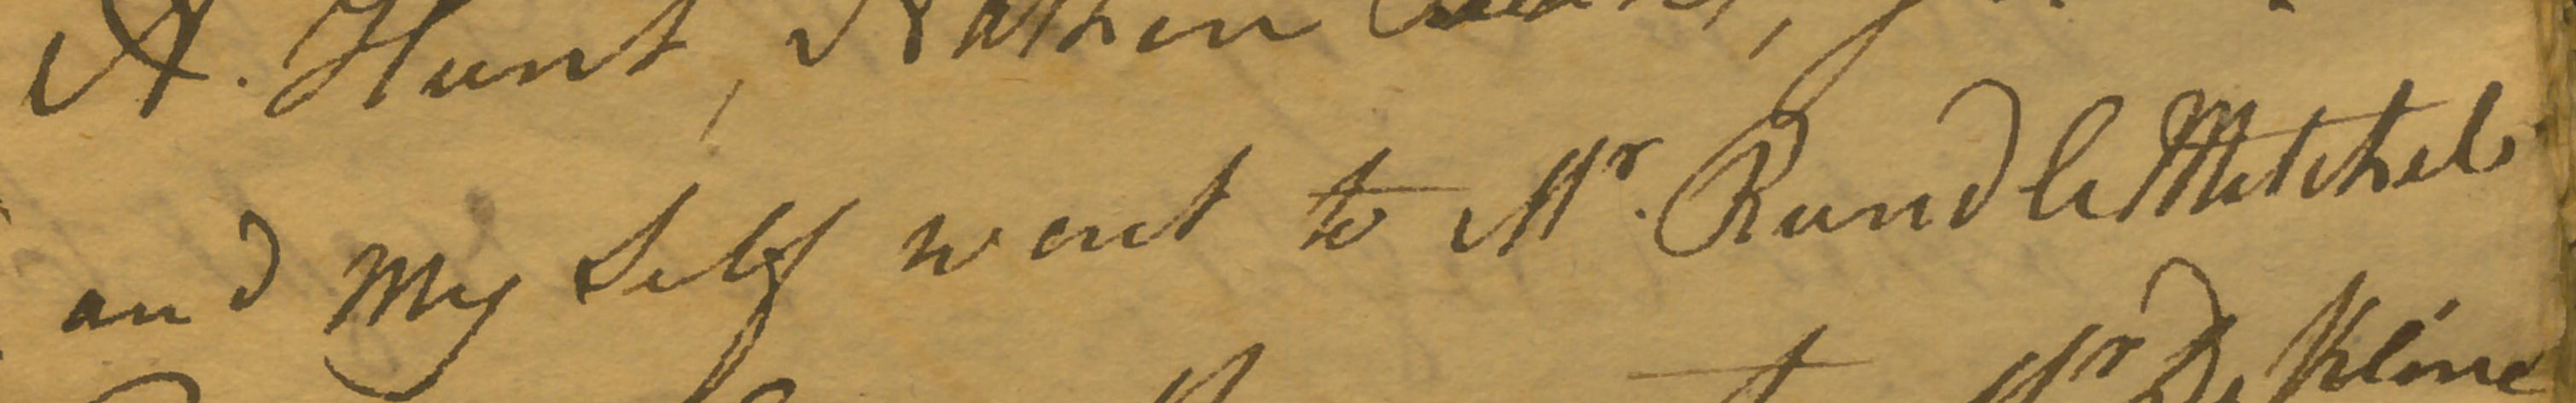and My self went to M^r Randle Mitchels
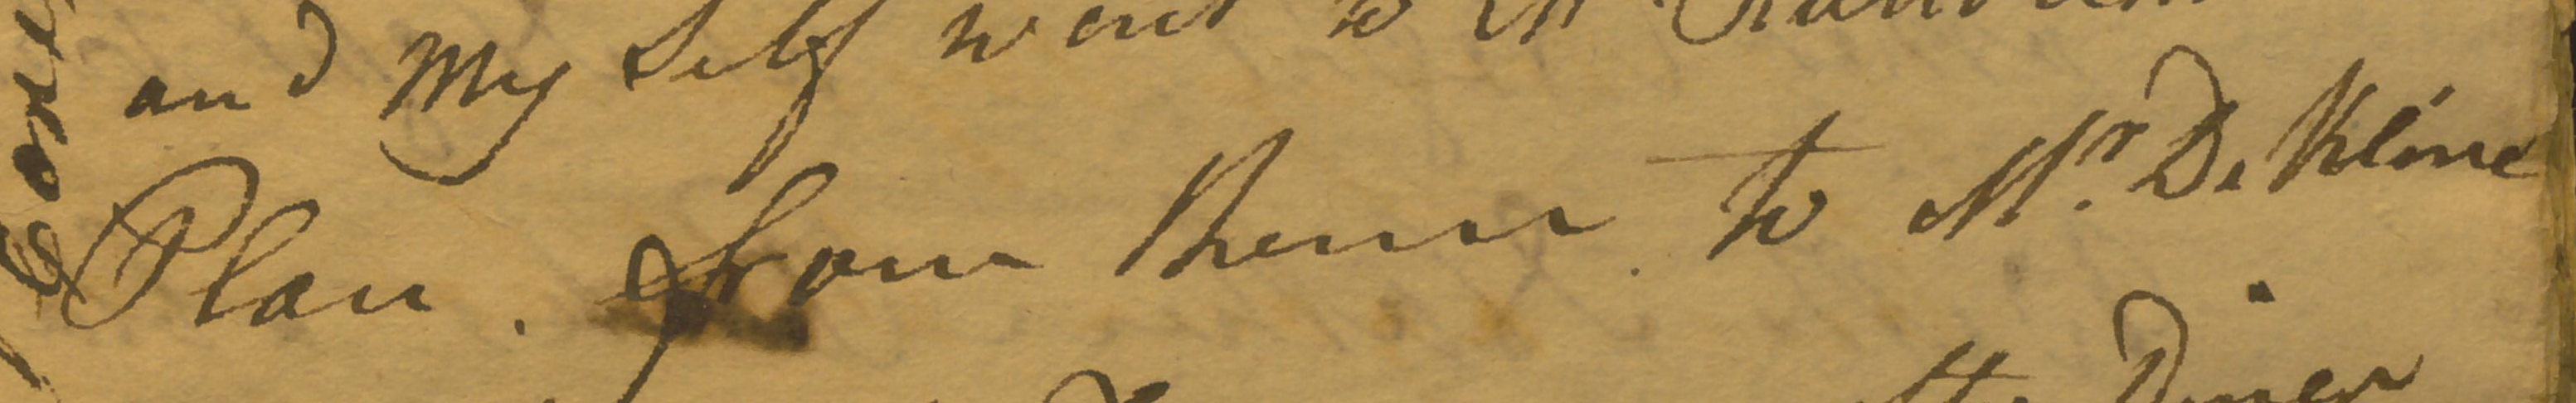Place. from thence to M^r. Dekline
